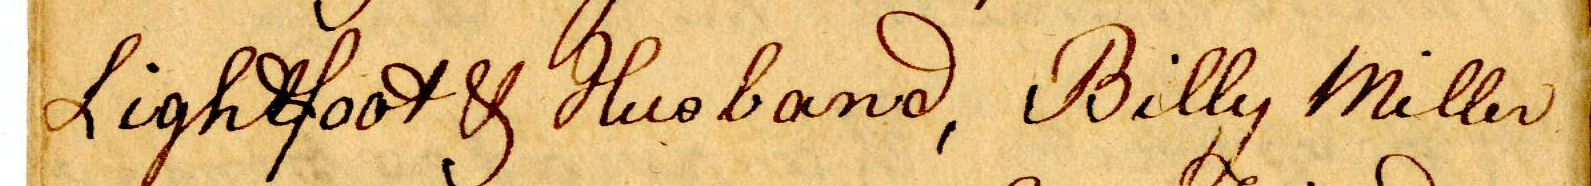Lightfoot & Husband, Billy Miller
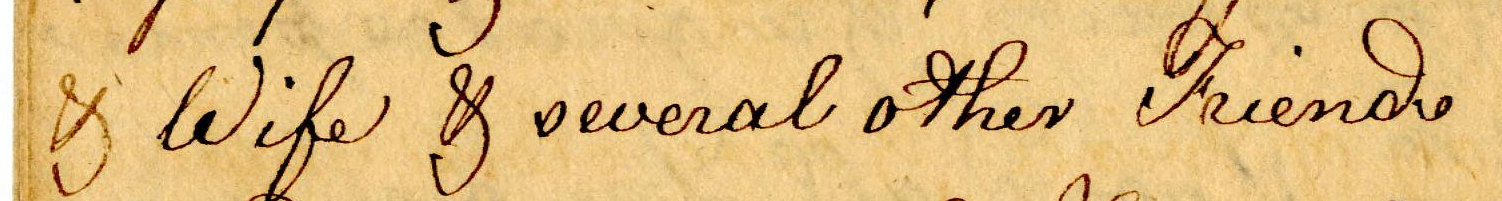& Wife & several other Friends
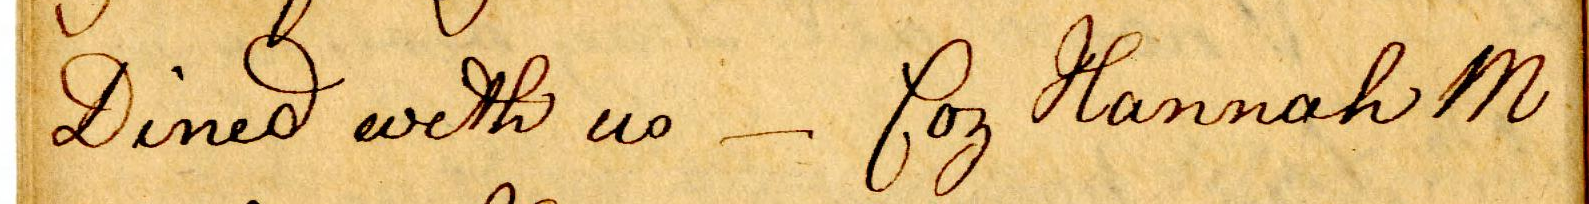Dined with us- Coz Hannah M.
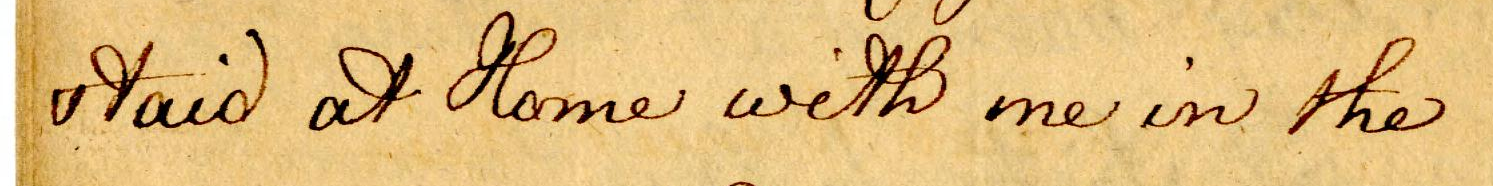staid at Home with me in the
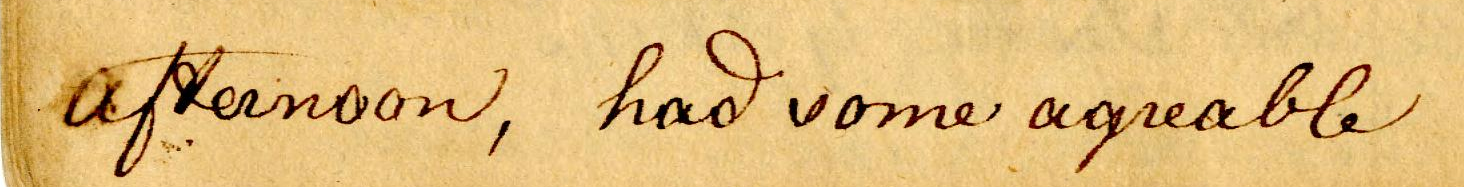Afternoon, had some agreable
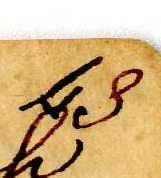43
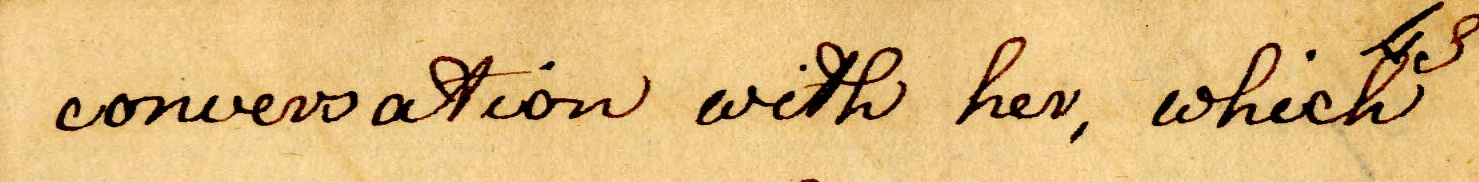conversation with her, which
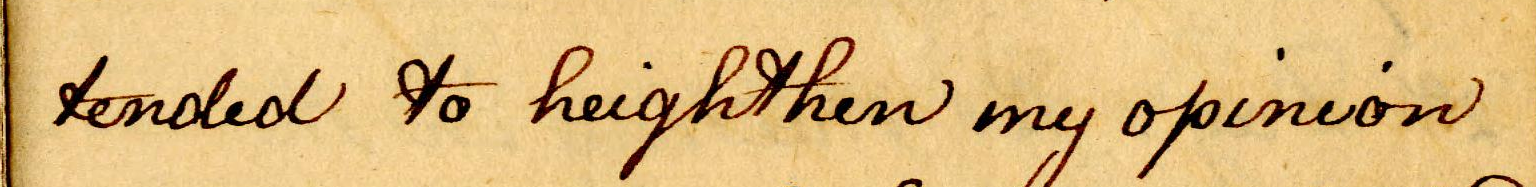tended to heighthen my opinion
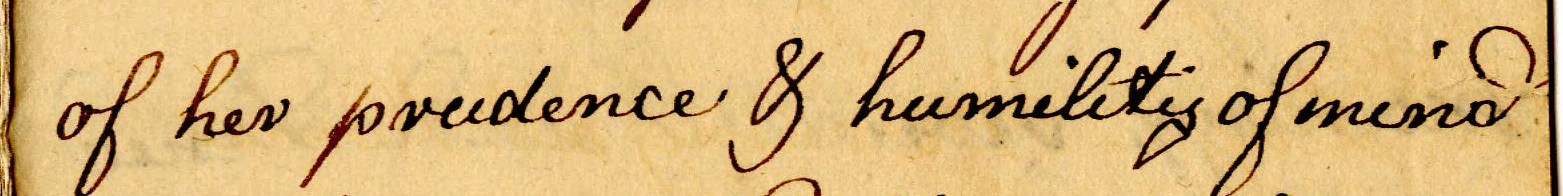of her prudence & humility of mind
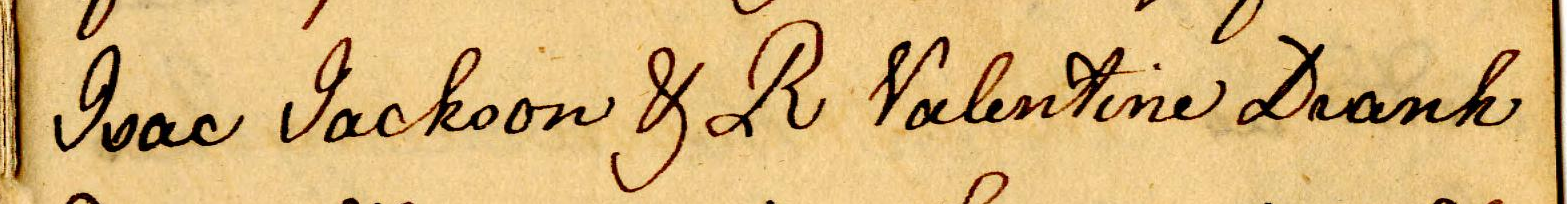Isac Jackson & R Valentine Drank
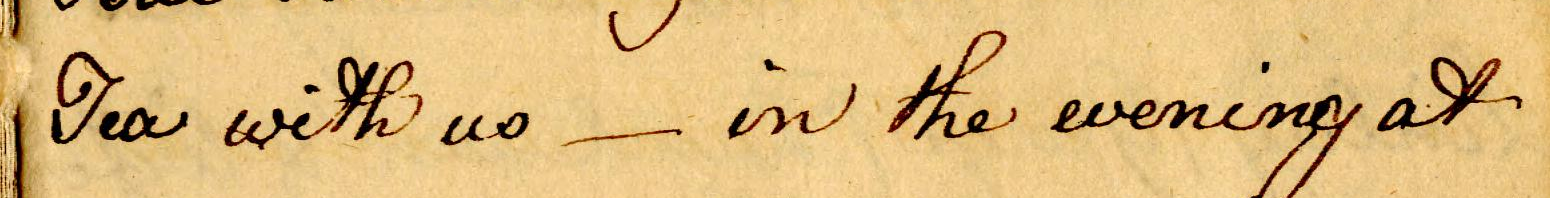Tea with us- in the evening at
